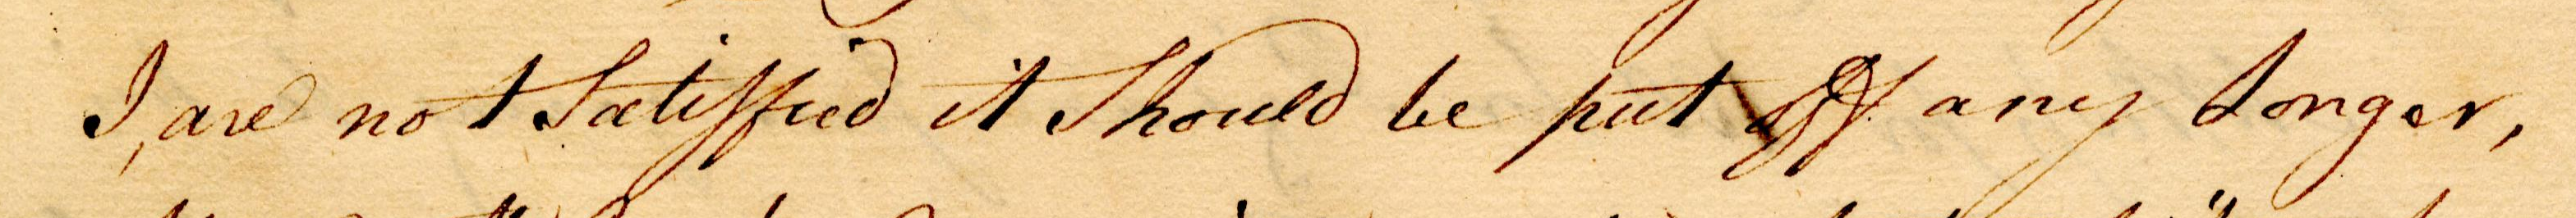I are not Satisfied it Should be put off any Longer,
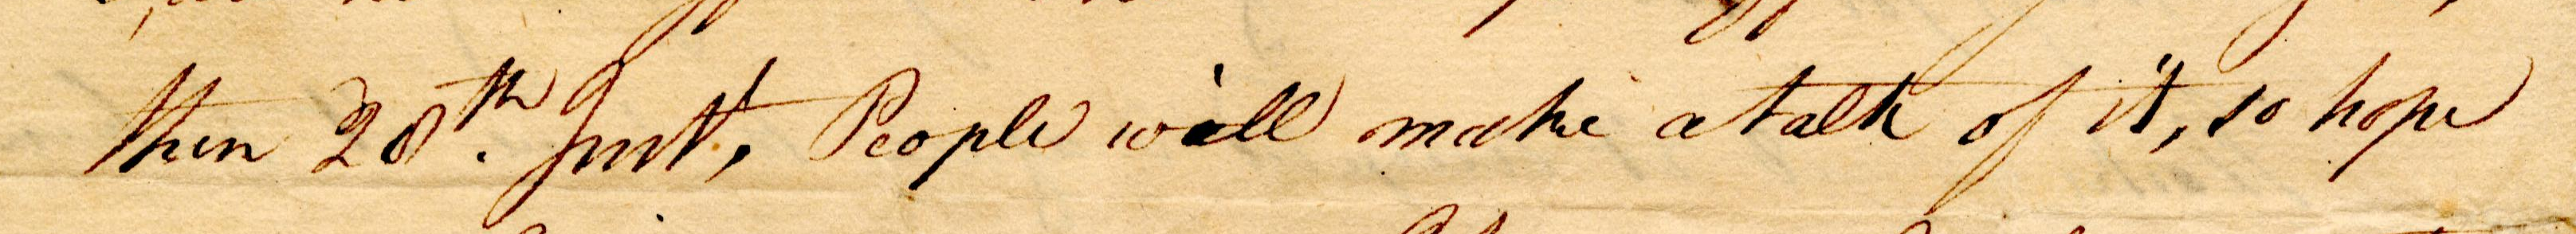then 28^th. Inst^t, People will make a talk of it, to hope
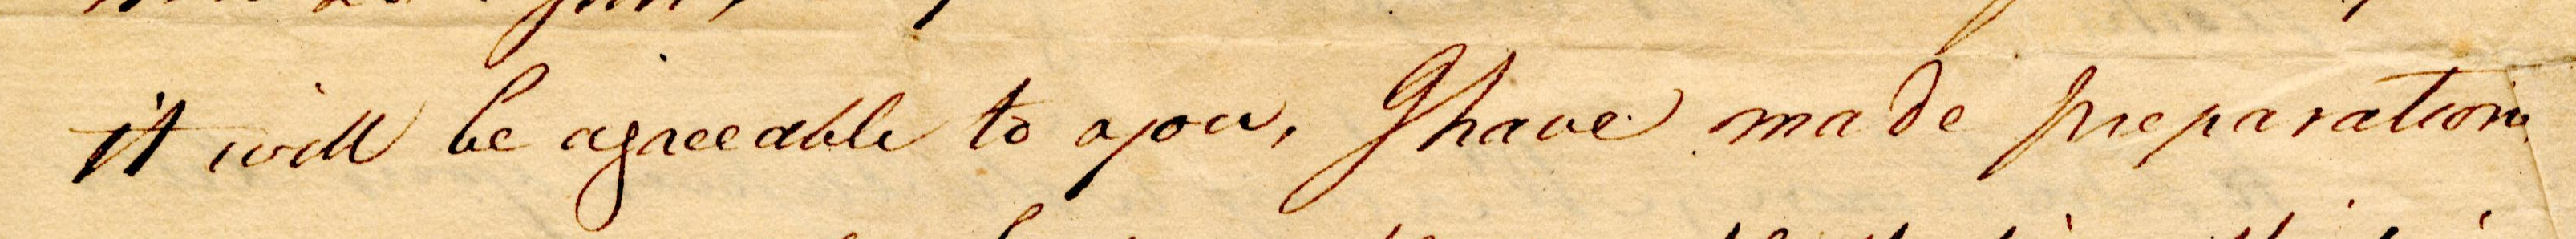it will be agreeable to you, I have made preparation
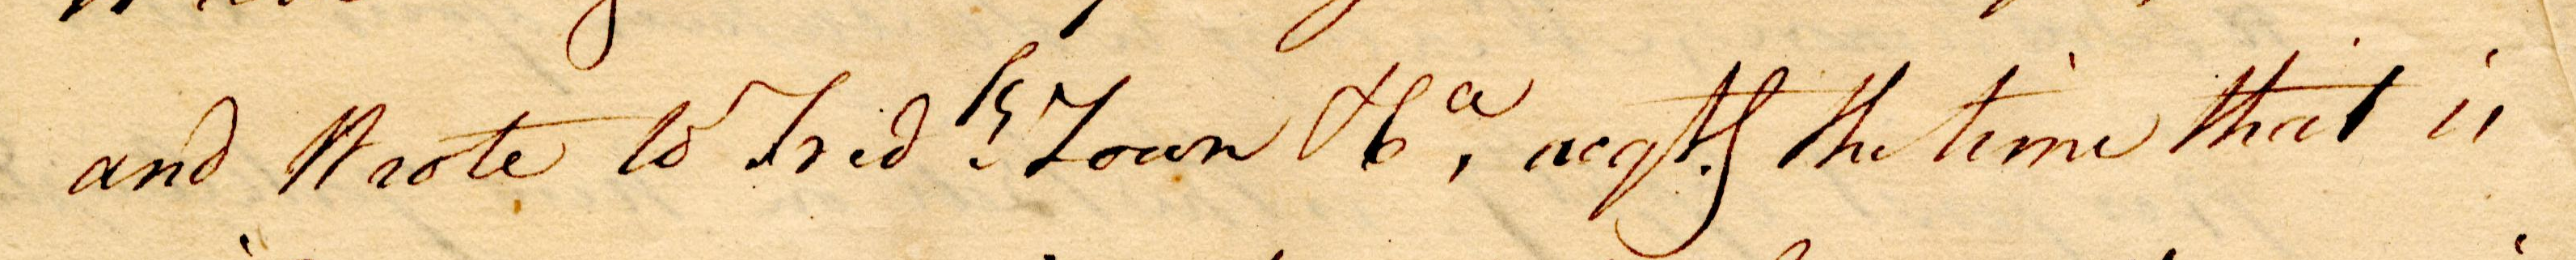and Wrote to Fred^k Town &C^a, req^tg. the time that is
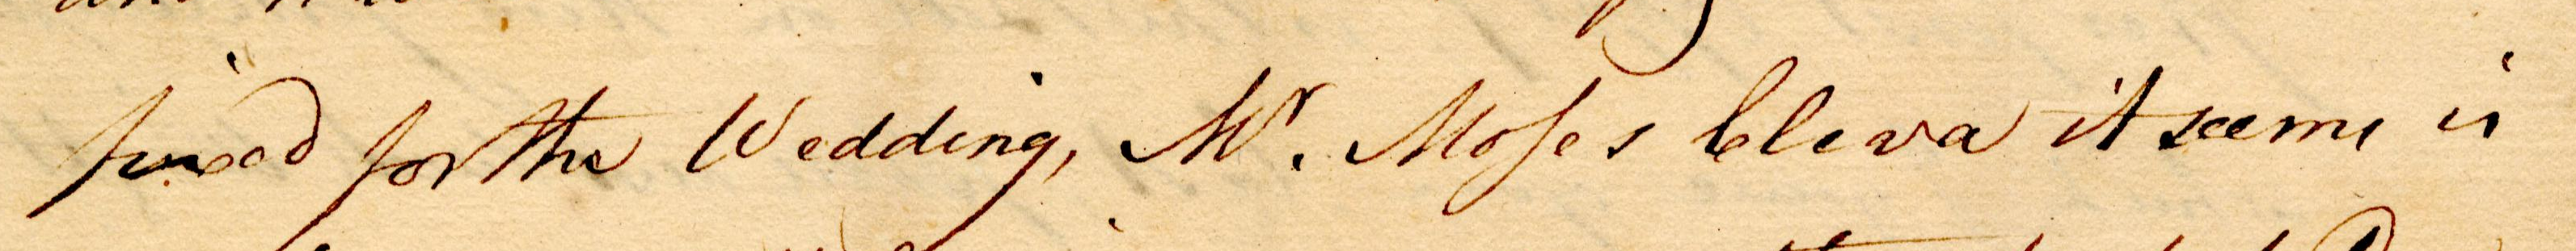fixed for the Wedding, M^r. Moses Cleva it seems is
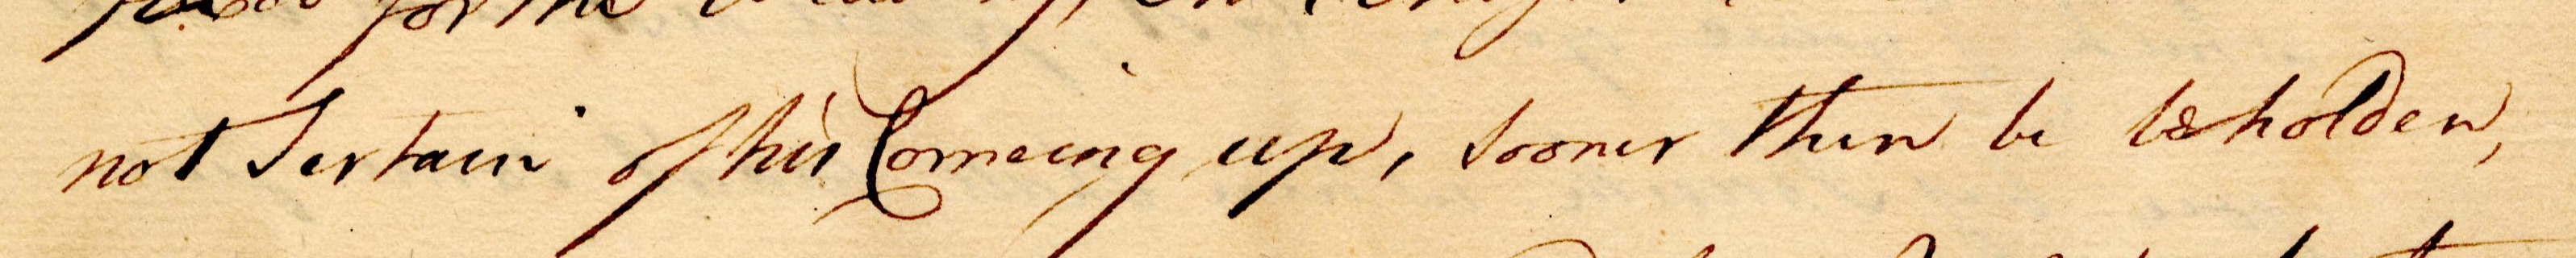not sertain of his Comeing up, sooner then be beholden,
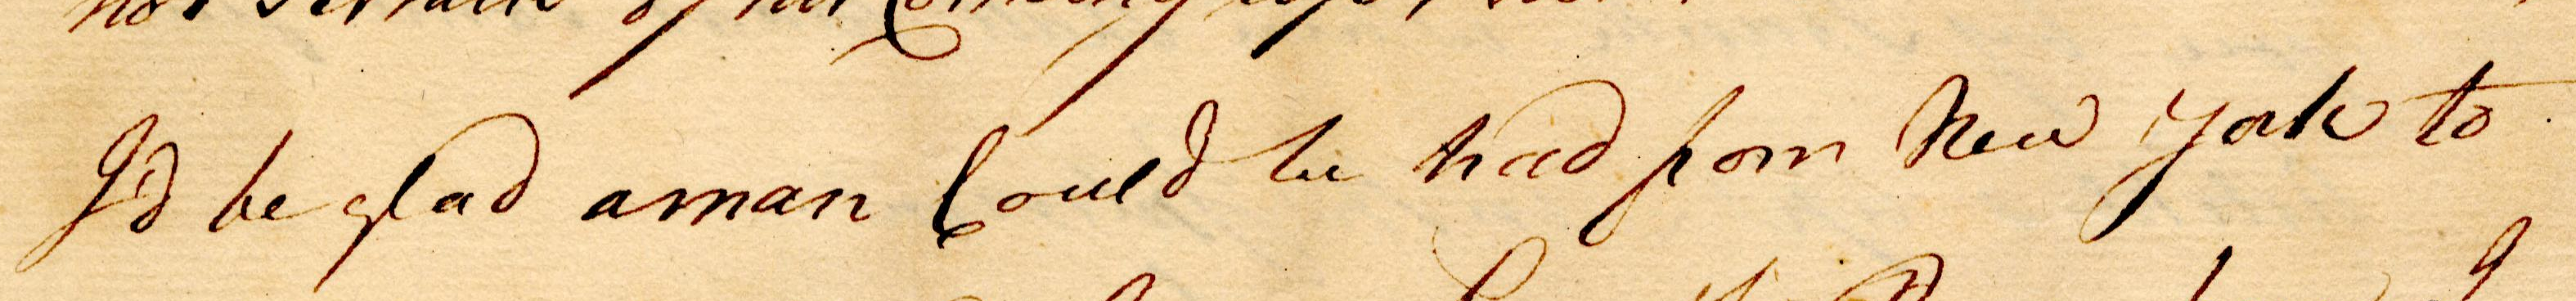I'd be glad a man Could be had from New York to
